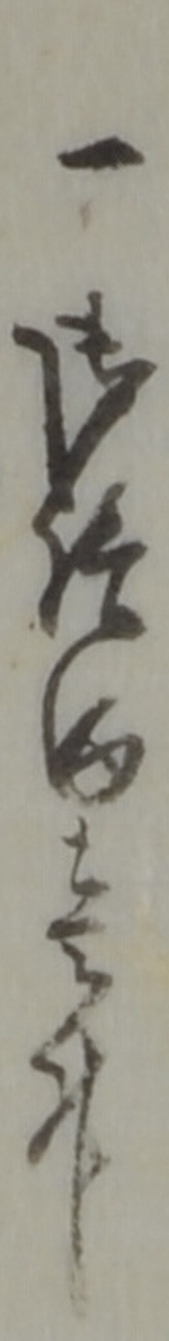一御清酒壱升
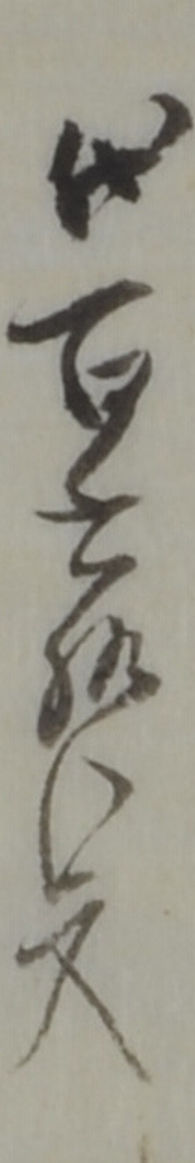代百六拾八文
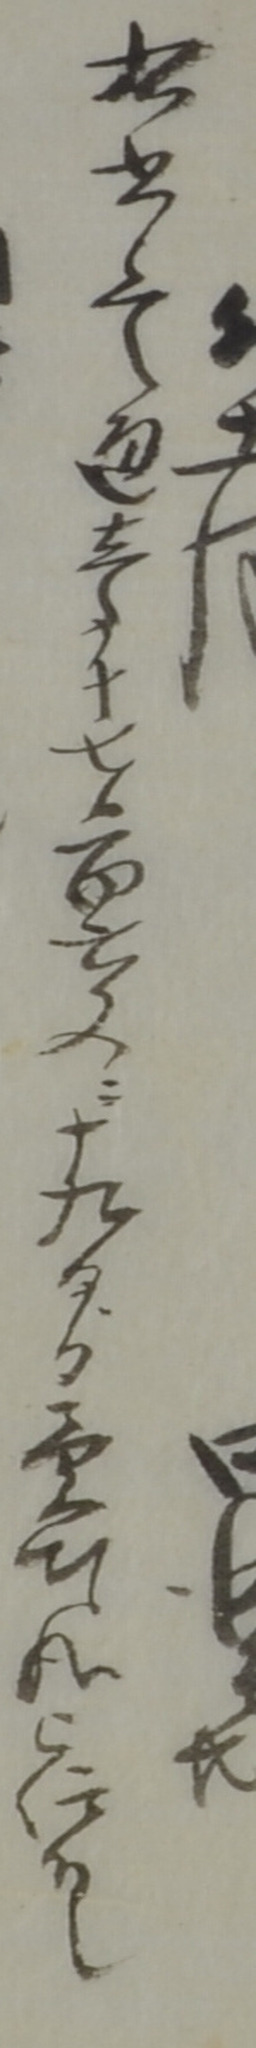右書上之通去月十七日百六文ニ十九日ゟ売出候様被仰付候
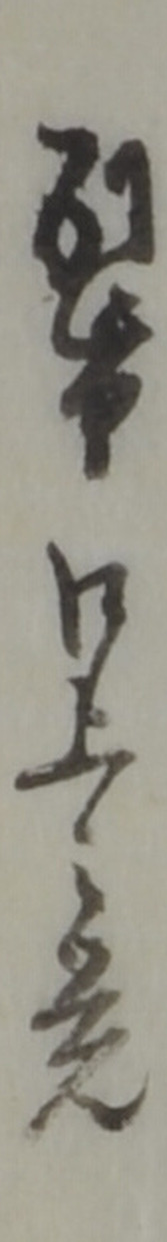別紙口上覚
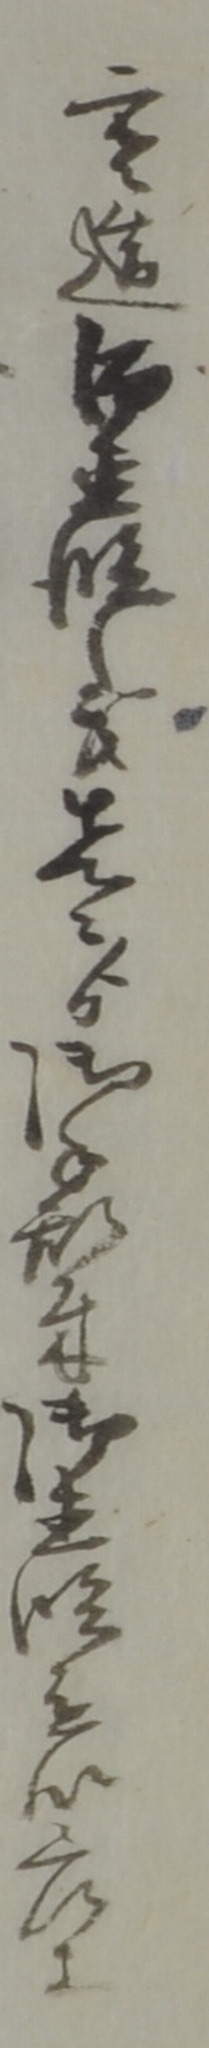寒造酒直段之義先々ゟ御手形米御直段を以差上
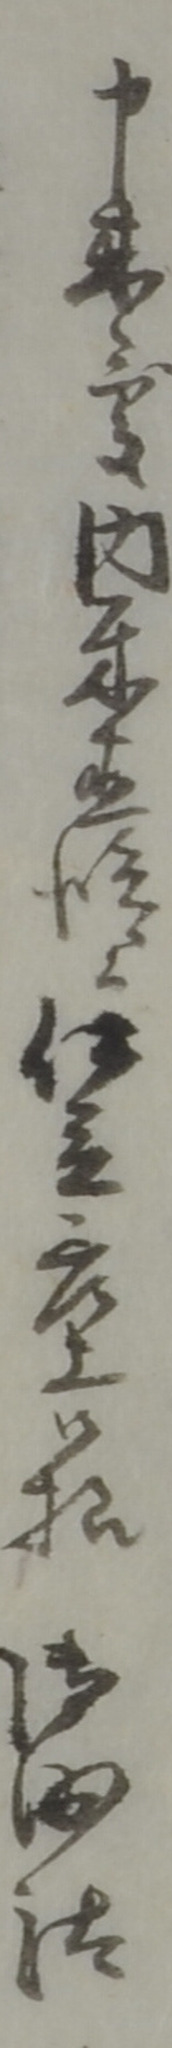申来候處内米直段ニ而仕立差上候様御沙汰
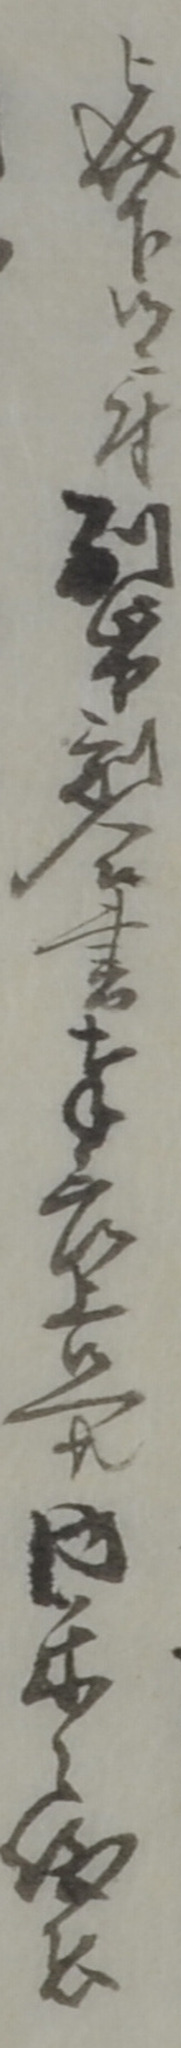被成下候ニ付別紙割合書奉差上候へ共内米之儀者
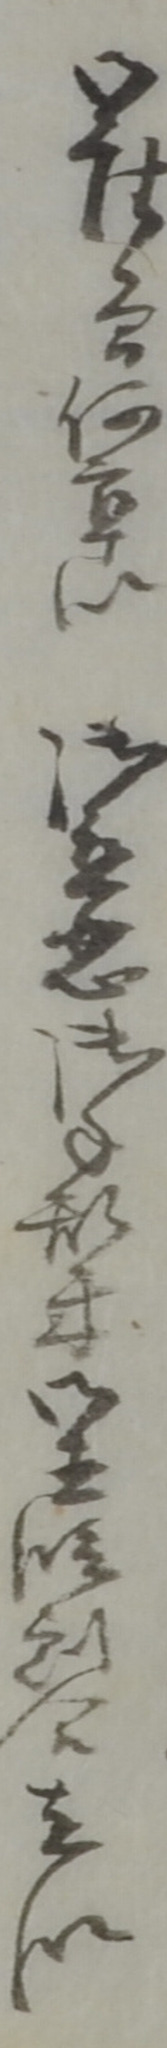御座候間何卒以御慈悲御手形米御直段割合を以
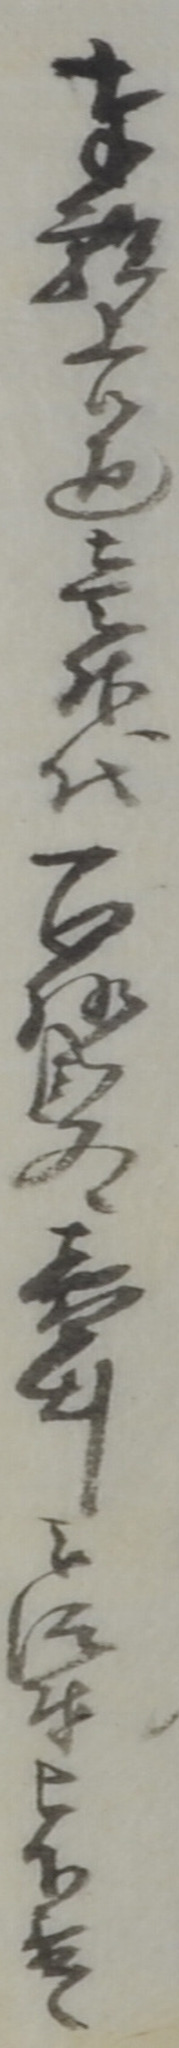奉願上候通壱升代百拾弐文ニ売出し被仰付被下置候

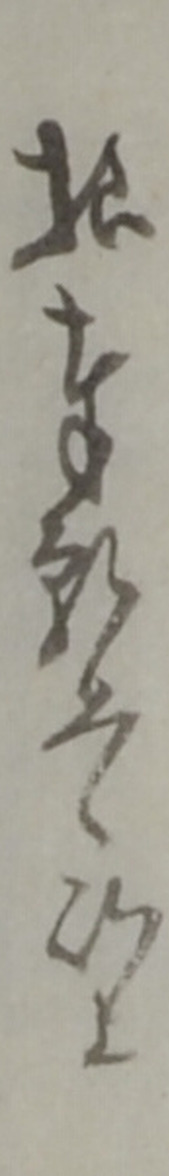様奉願上候以上
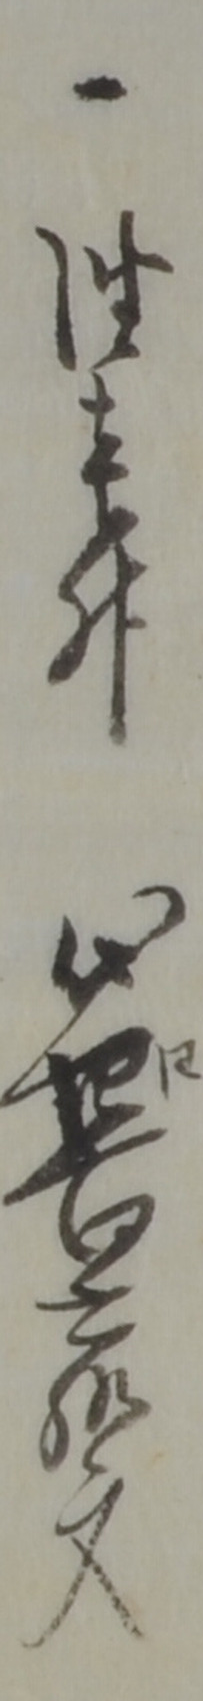一油壱升代四百六拾文
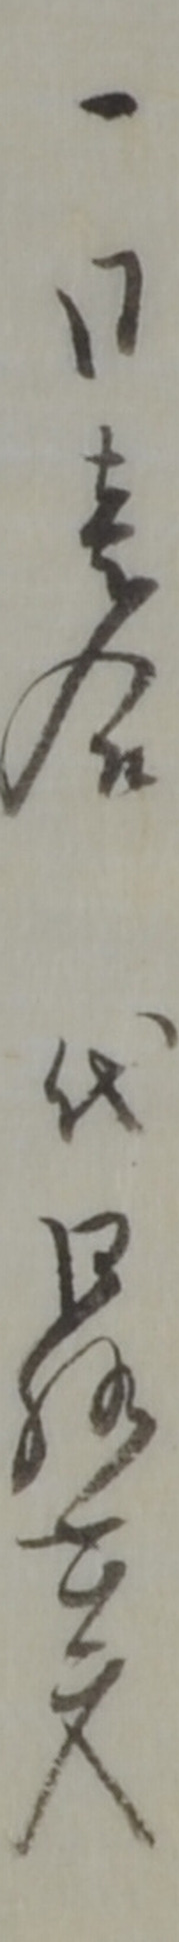一同壱合代四拾六文
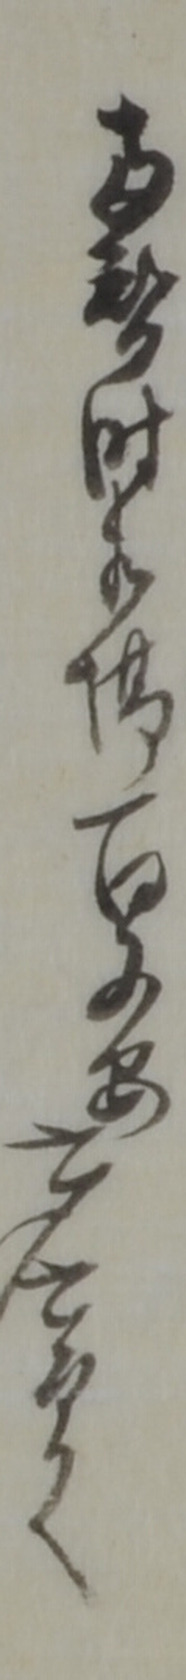両替時相場百文安六貫六百文
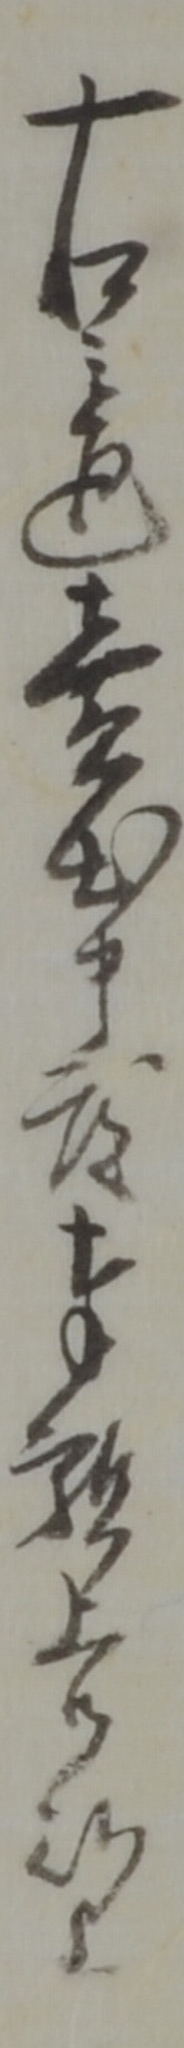右之通売出申度奉願上候以上
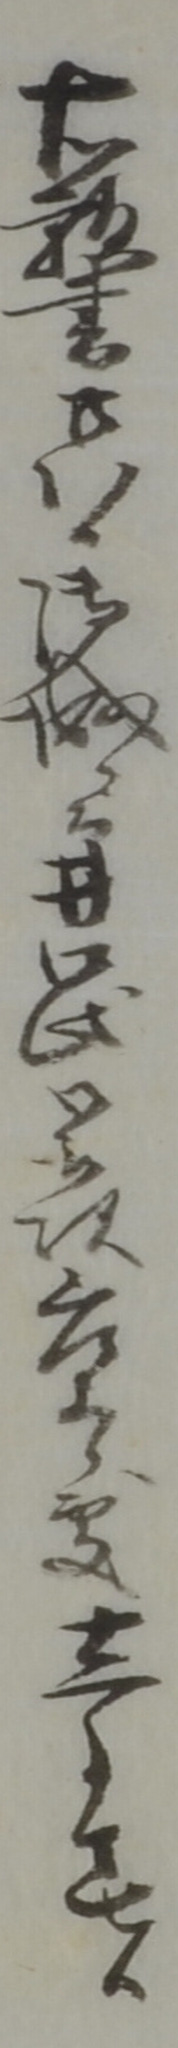右願書二十八日御城ニ而井口氏御取次差上候處十二月十七日
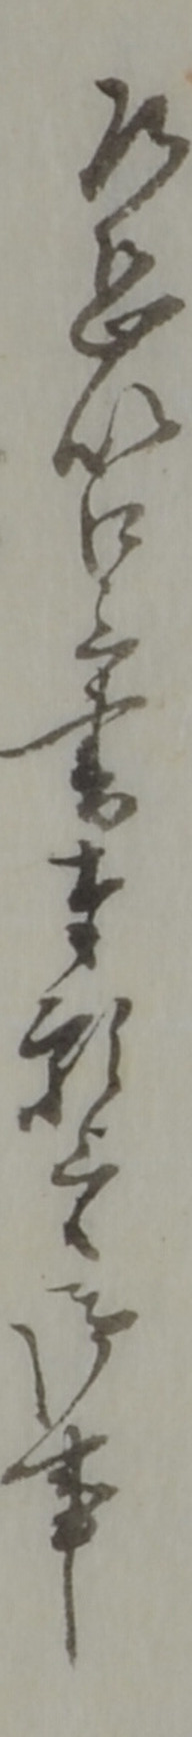乍恐以口上書奉願上候御事
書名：諸願書控簿
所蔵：伊那市立高遠町図書館・合同会社AMANE
